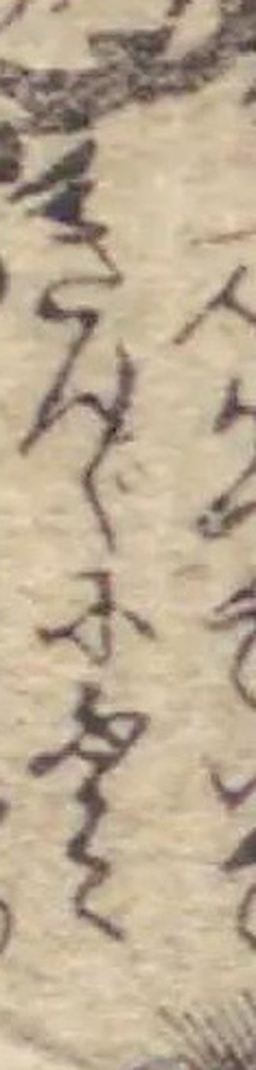さん〴〵にふみ
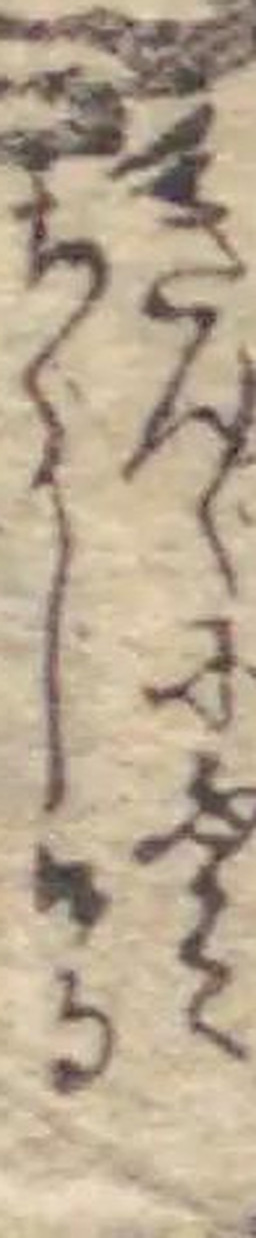ちらしける
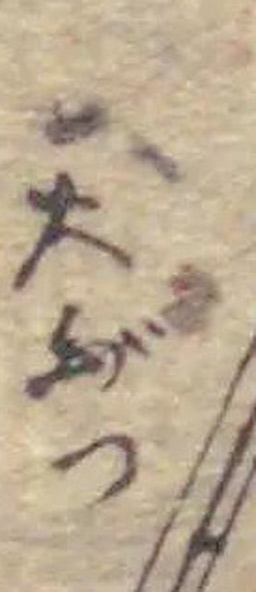大ぶつ
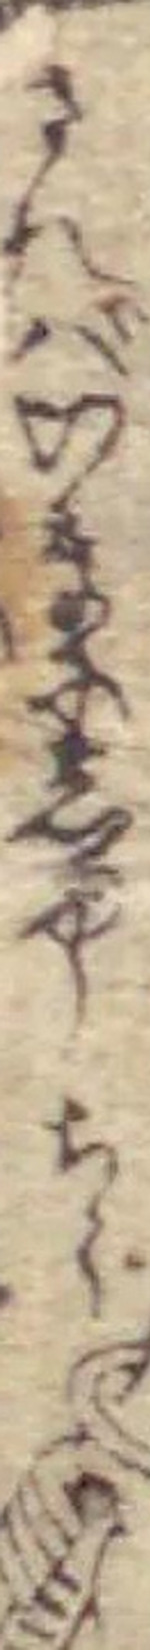さればいまにしやうちう
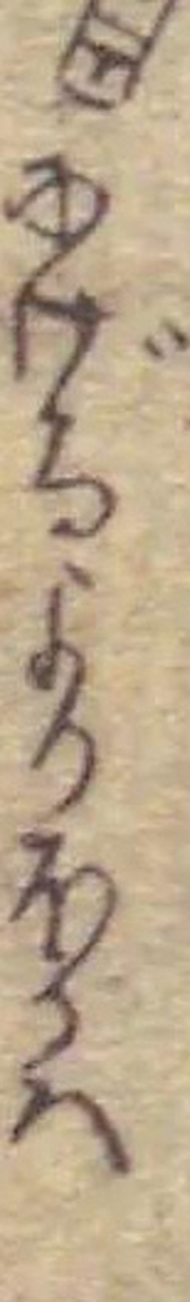にげるよりほかは
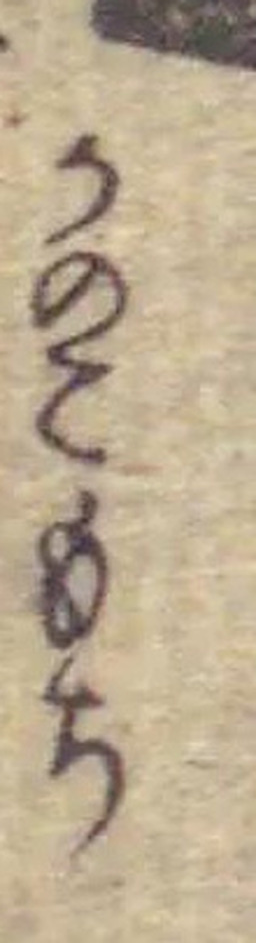かのこもち
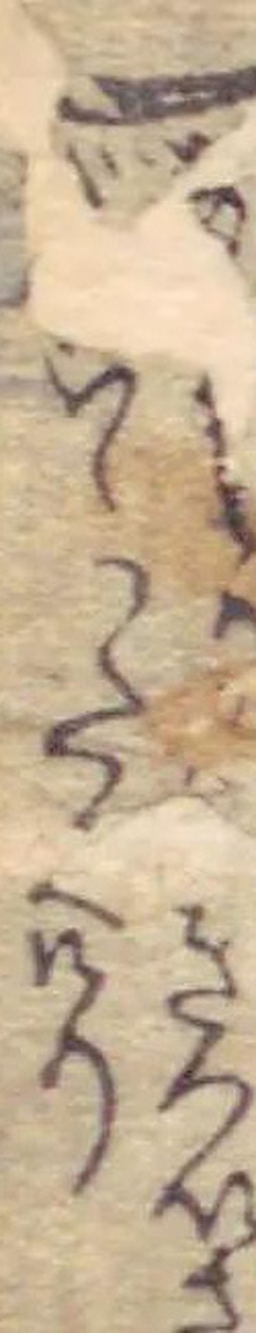いゝつたへけり
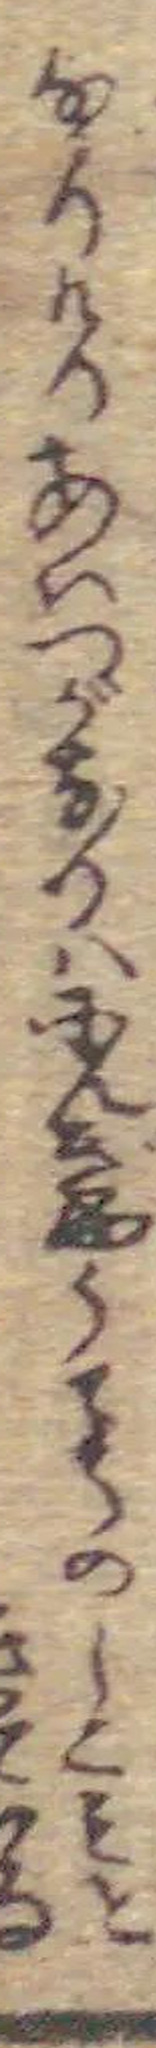なかりけりあいつがなりはにんぎやうてうのしこみと
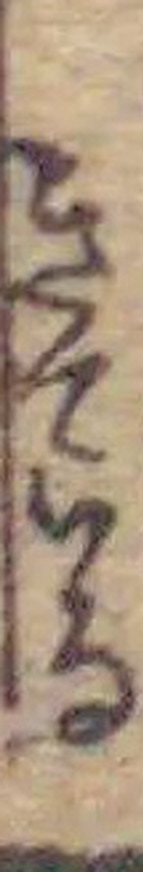きている

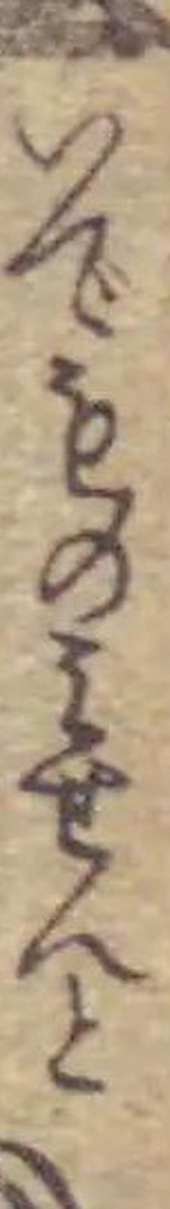いでものみせんと
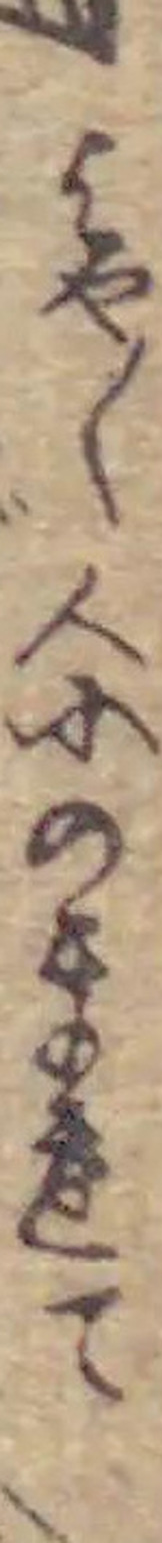はや〳〵人にのまれて
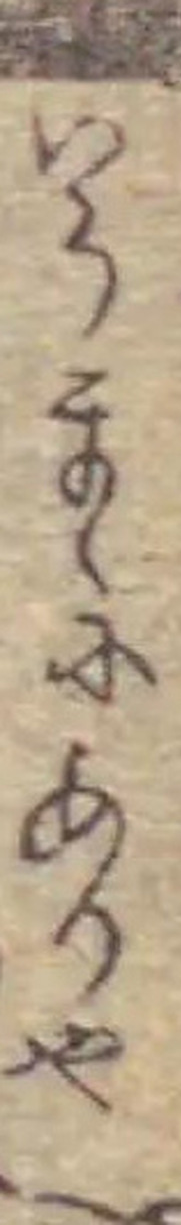いうまゝにありや
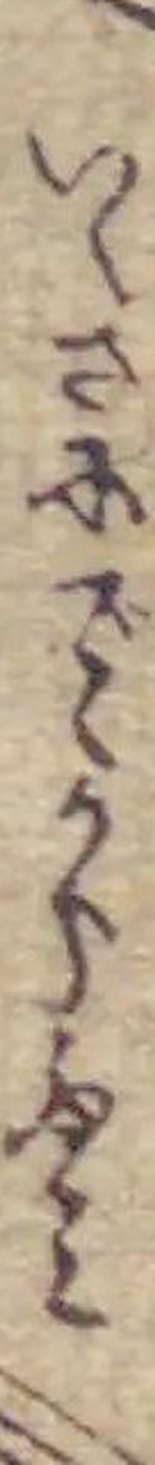いくさにでゝからふみ
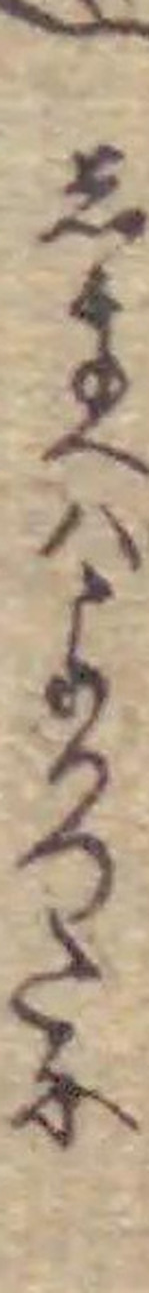しまへばよかつたに
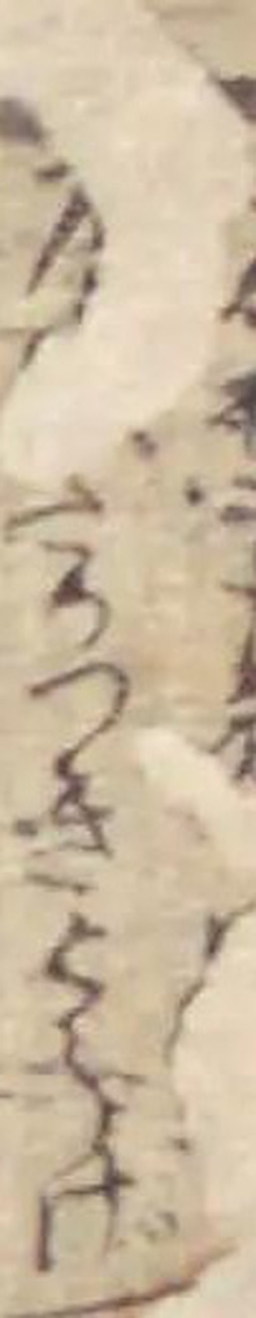かつきとうげ
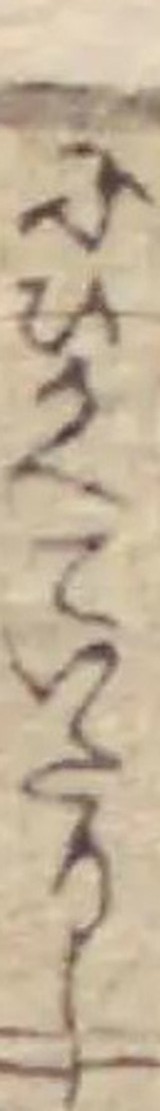にひかへていたりしが
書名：餅酒腹中能同志 2巻
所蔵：国立国会図書館 National Diet Library, JAPAN
